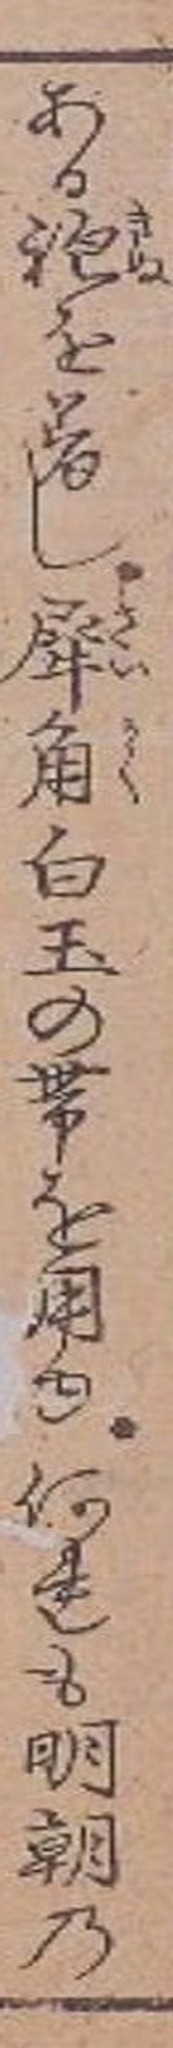ある袍を着し•犀角白玉の帯を用ゆ•何れも明朝の
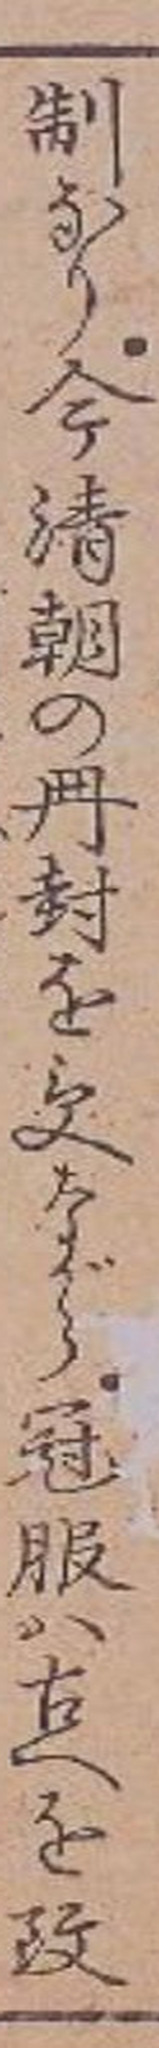制なり•今清朝の冊封を受ながら•冠服は古へを改
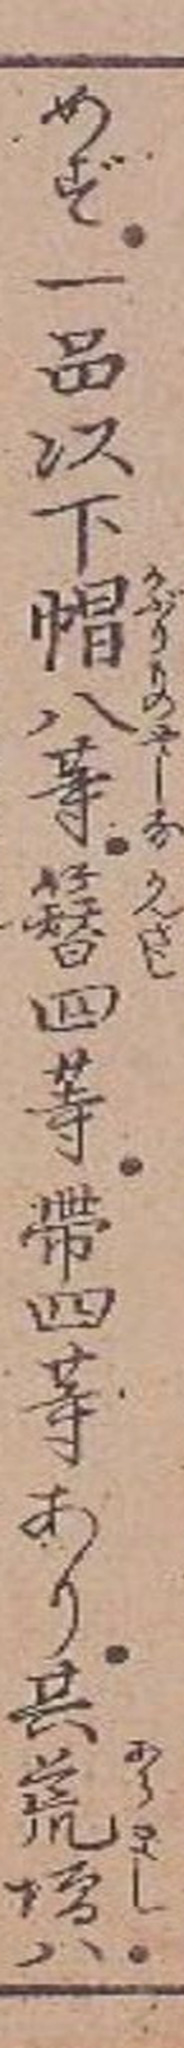めず•一品以下帽八等•簪四等•帯四等あり•荒増は•
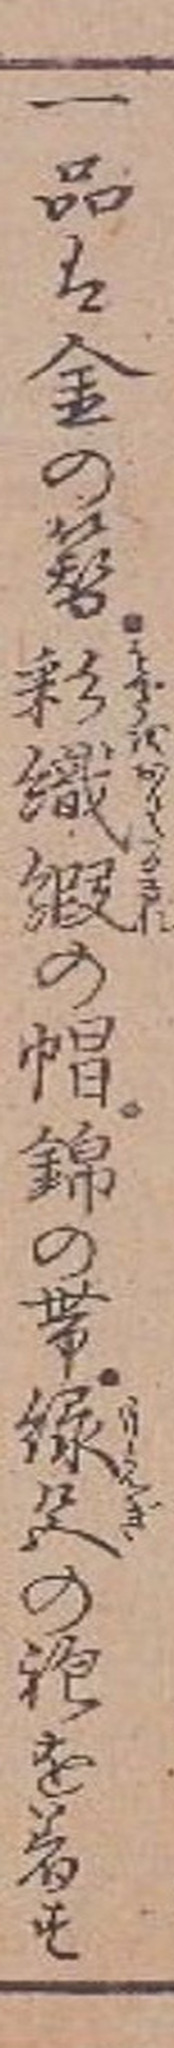一品は金の簪•彩織緞の帽•錦の帯•緑色の袍着す
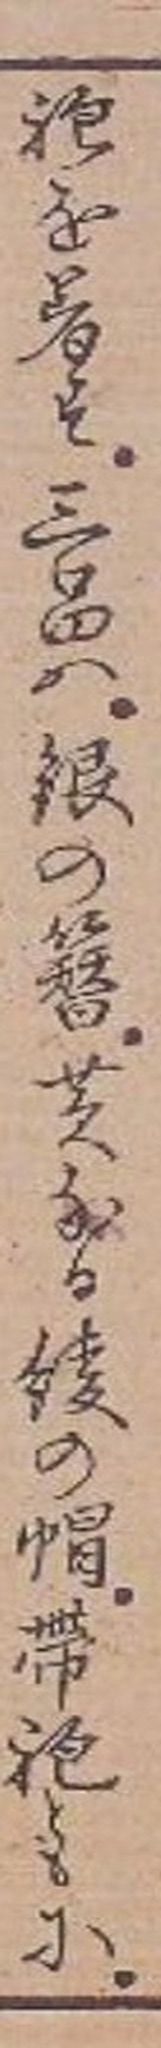袍を着す•三品は•銀の簪•黄なる綾の帽•帯袍ともに•
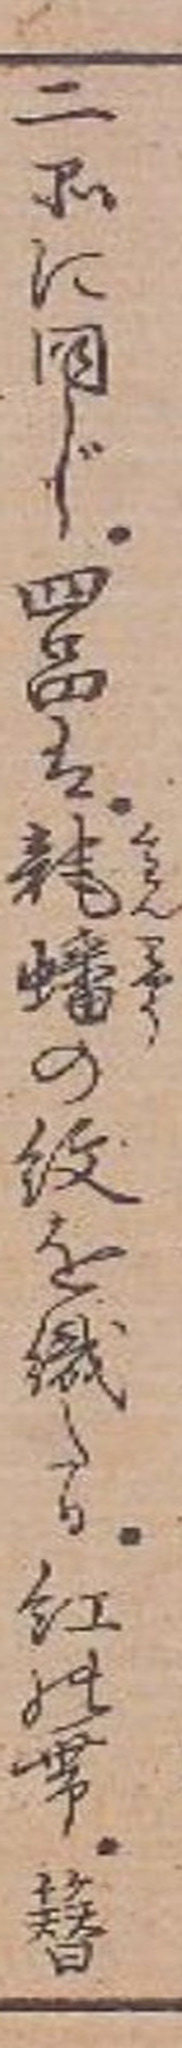二品に同じ•四品は•龍蟠の紋を織たる•紅の帯•簪
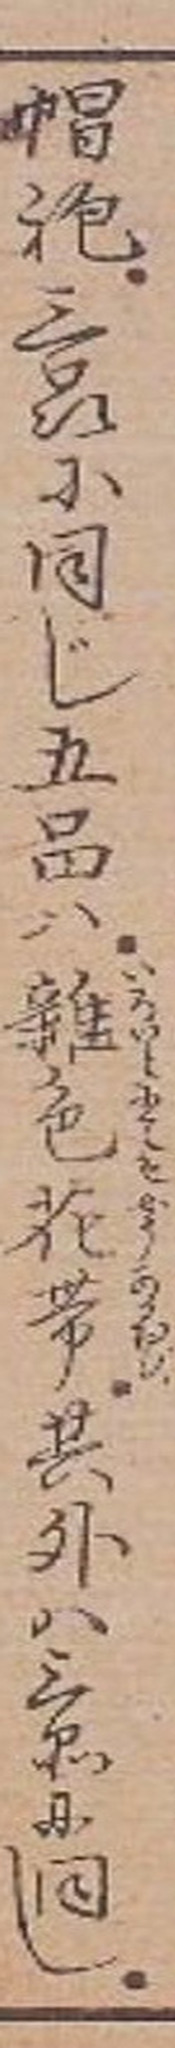帽袍•三品に同じ五品は•雑色花帯•其外は三品に同じ•
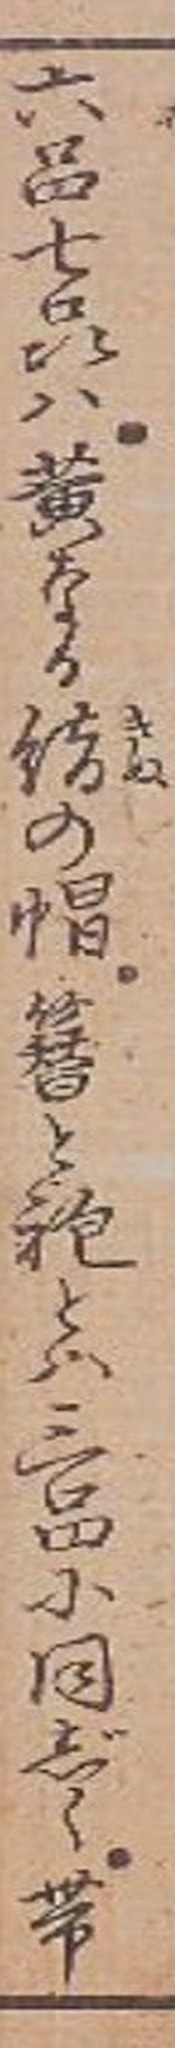六品七品は•黄なる絹の帽•簪と袍とは三品に同じく•帯
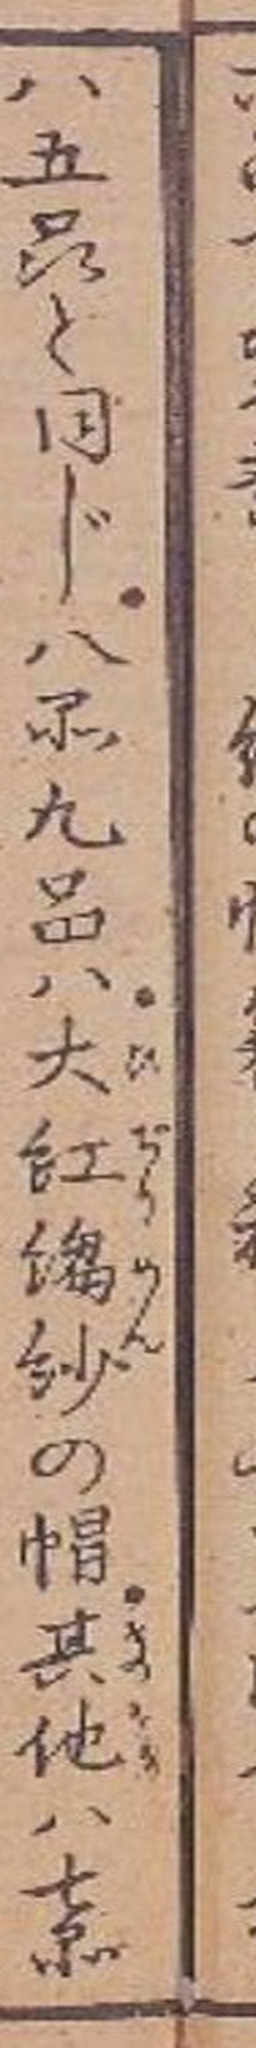は五品と同じ•八品九品は•大紅縐の帽•其他は七品
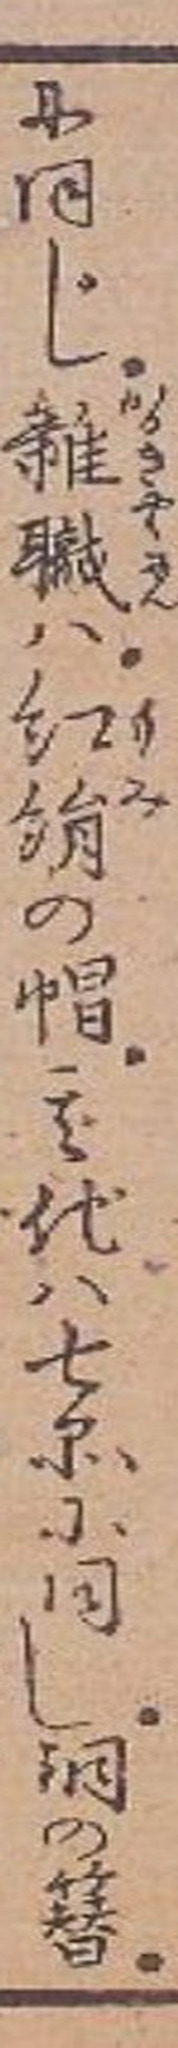に同じ•雑職は•紅絹の帽•其他は七品に同じ•同の簪•
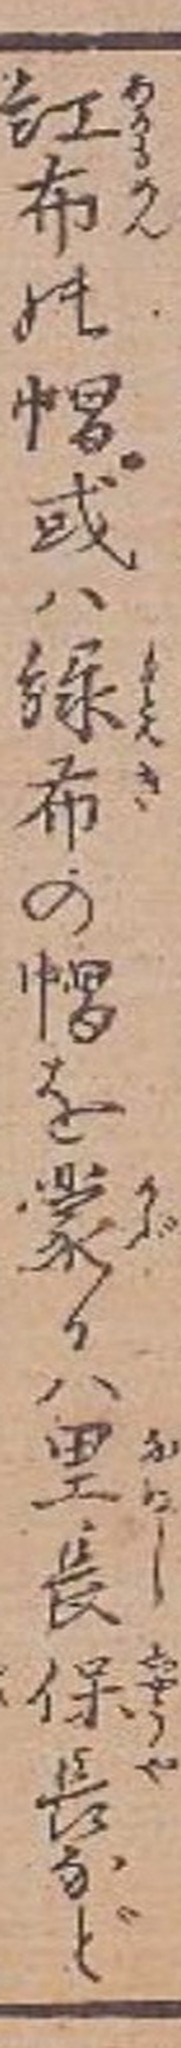紅布の帽•或は緑布の帽を蒙るは里長保長など
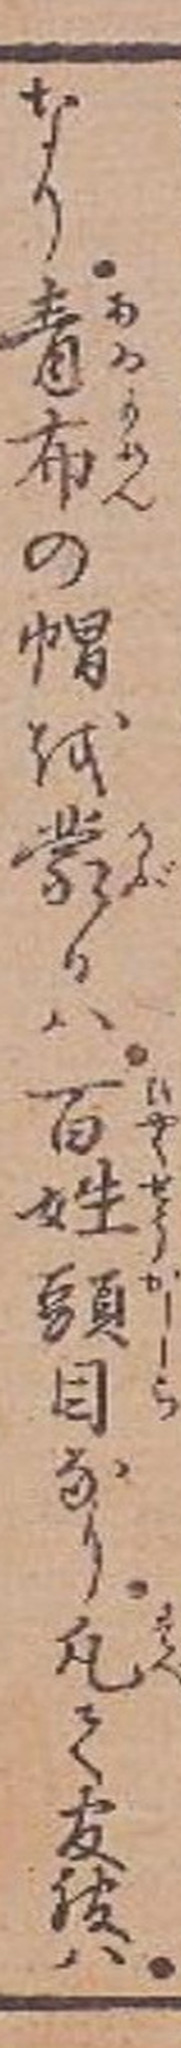なり•青布の帽を蒙るは•百姓頭目なり•凡て官服は•
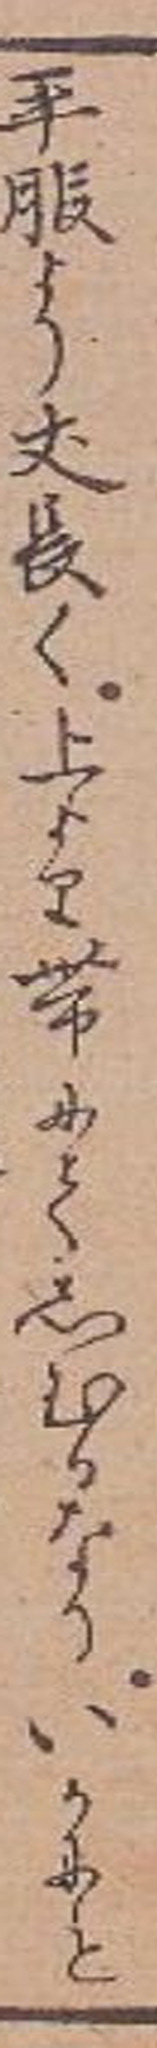平服より丈長く•上より帯にてしむるなり•いかにも
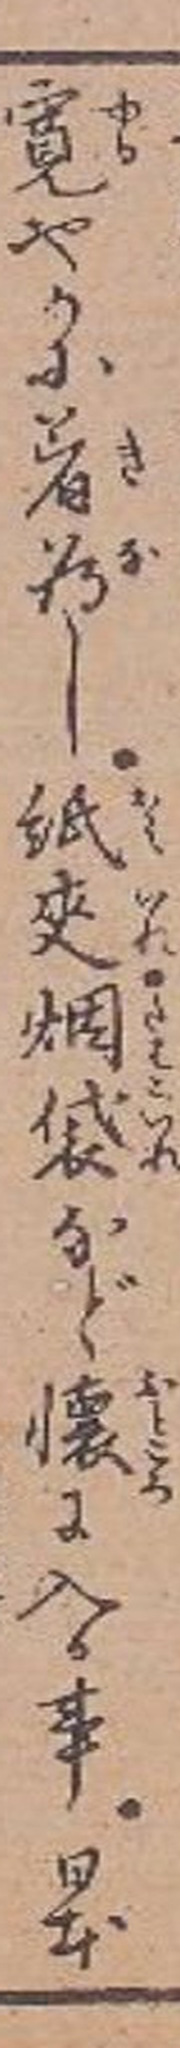寛やかに着為し•紙夾•烟袋など懐に入る事•日本
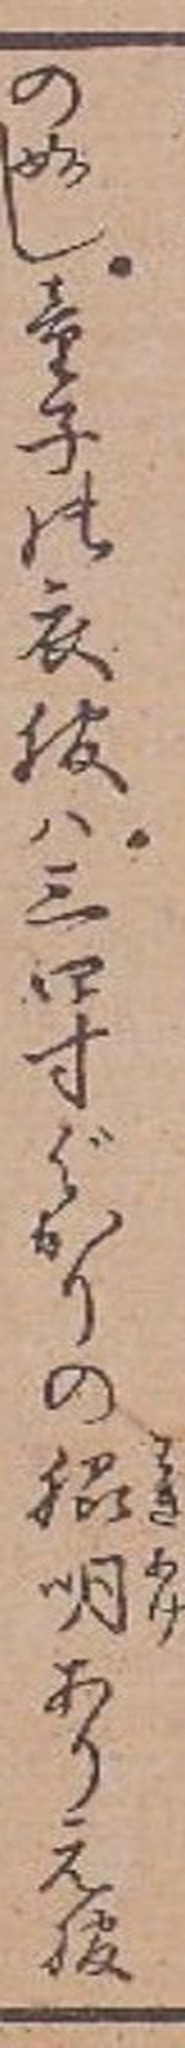の如し•童子の衣服は•三四寸ばかりの脇明あり元服
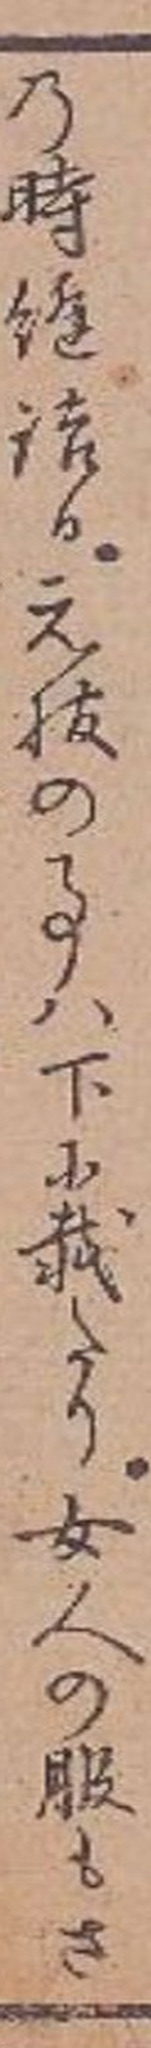の時縫詰る•元服の事は下に載たり•女人服もさ
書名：琉球談
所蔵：University of the Ryukyus Library
